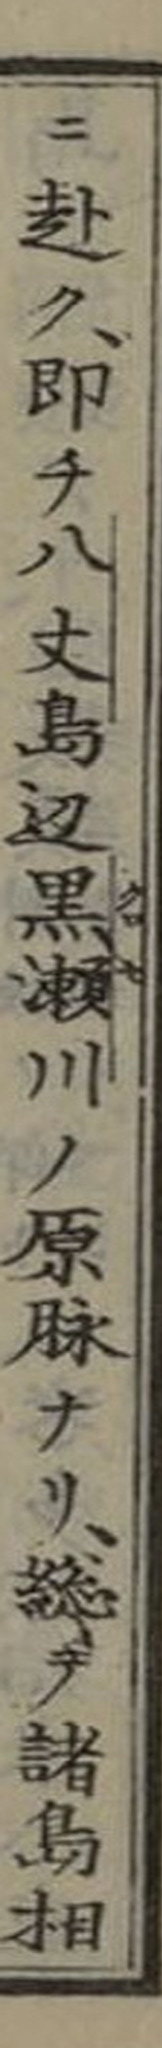ニ赴ク、即チ八丈島辺黒瀬川ノ原脈ナリ、総テ諸島相
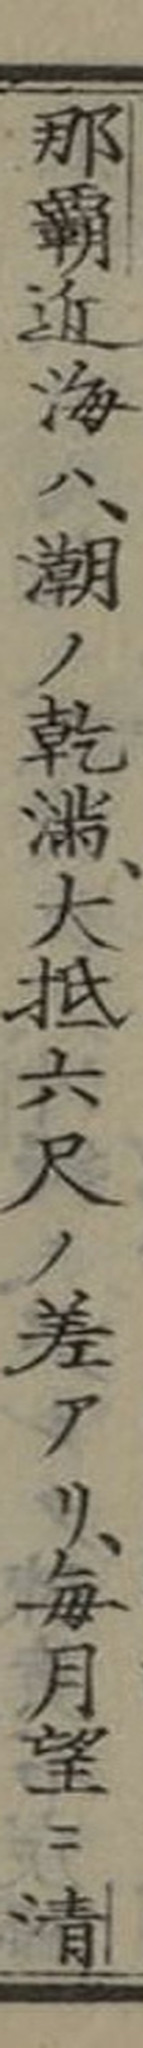那覇近海ハ、潮ノ乾満、大抵六尺ノ差アリ、毎月望ニ清
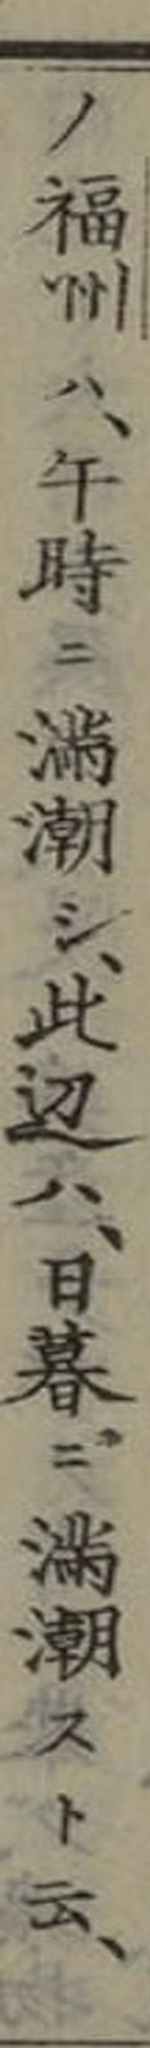ノ福州ハ、午時ニ満潮シ、此辺ハ、日暮ニ満潮スト云、
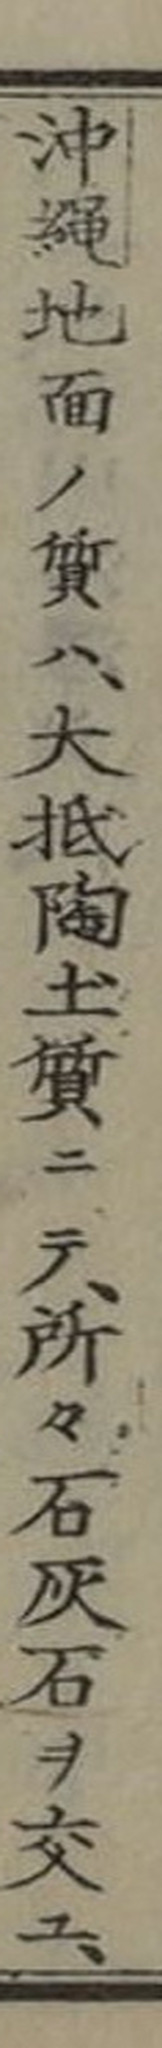沖縄地面ノ質ハ、大抵陶土質ニテ、所々石灰石ヲ交ユ、
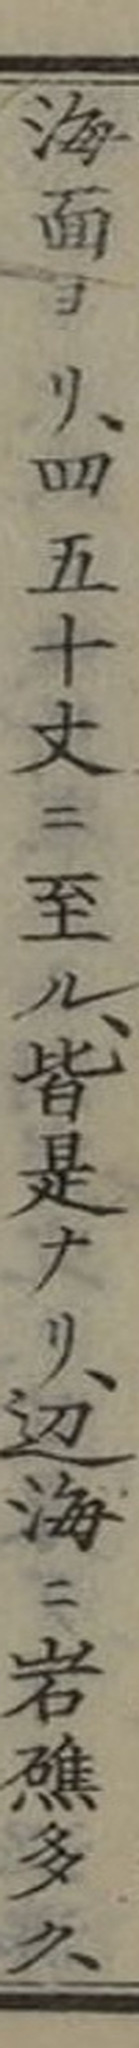海面ヨリ、四五十丈ニ至ル、皆是ナリ、辺海ニ岩礁多ク、
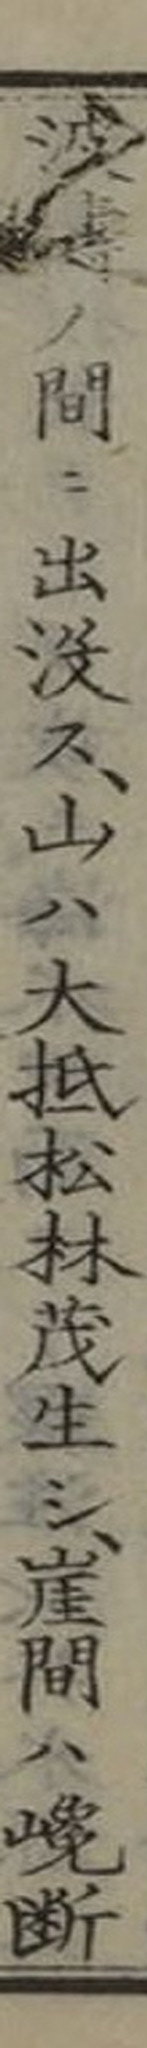波濤ノ間ニ出没ス、山ハ大抵松林茂生シ、崖間ハ巉断
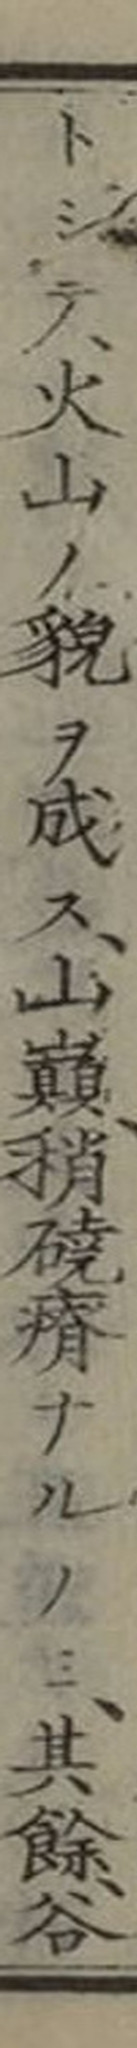トシテ、火山ノ貌ヲ成ス、山巓、稍磽瘠ナルノミ、其余、谷
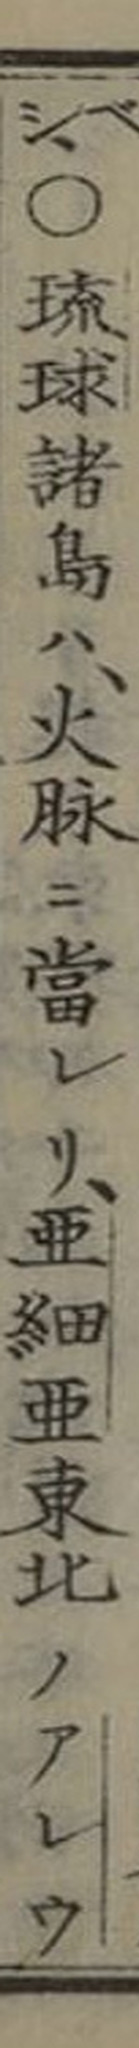ベシ、○琉球諸島ハ、火脈ニ当レリ、亜細亜東北ノアレウ

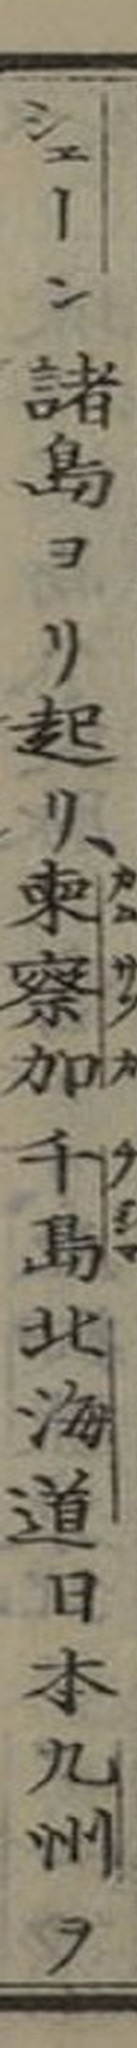シェーン諸島ヨリ起リ、柬察加千島北海道日本九州ヲ
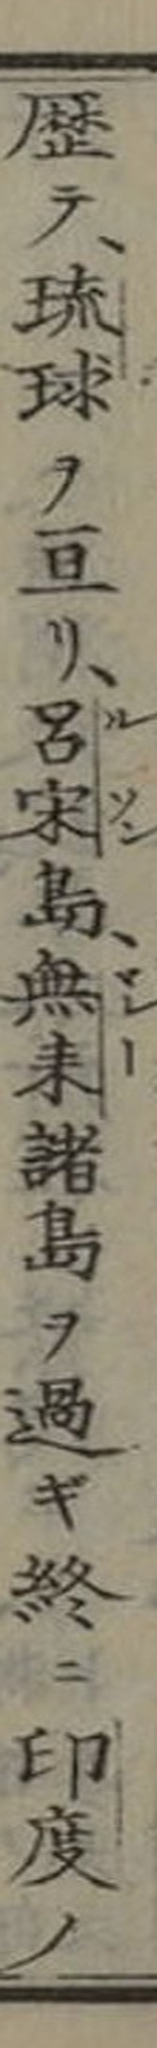歴テ、琉球ヲ亘リ、呂宋島、無来諸島ヲ過ギ終ニ印度ノ
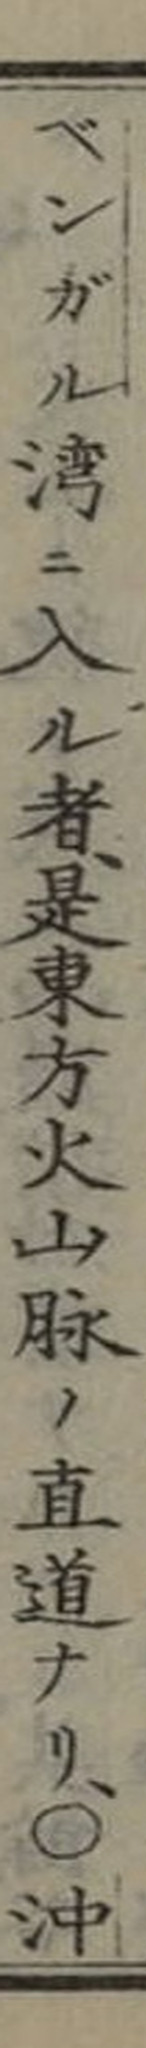ベンガル湾ニ入ル者、是東方火山脈ノ直道ナリ、○沖
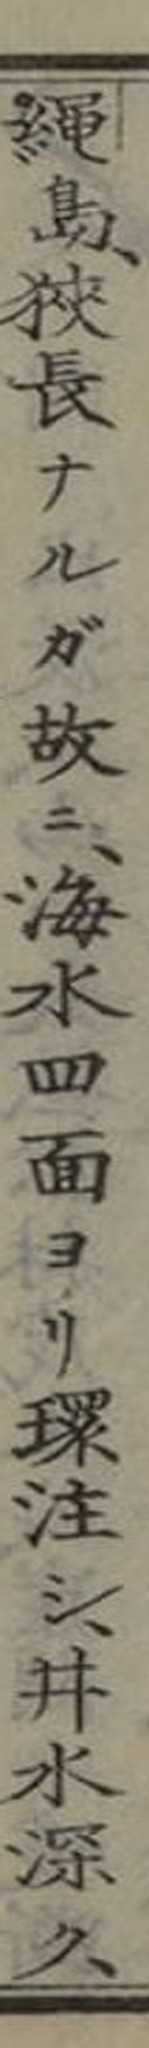縄島、狭長ナルガ故ニ、海水四面ヨリ環注シ、井水深ク、
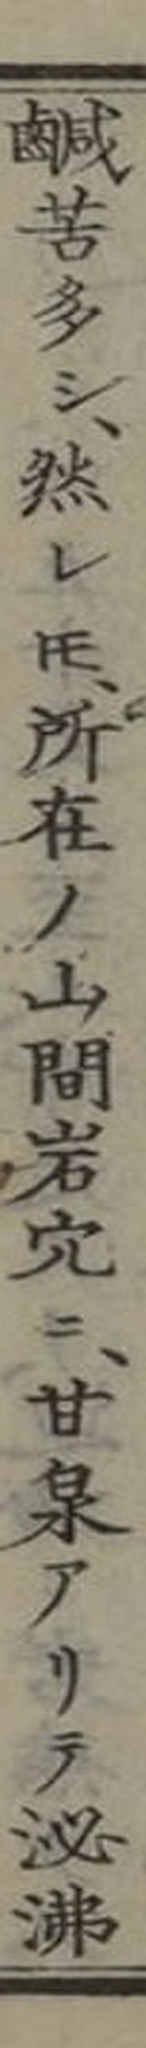鹹苦多シ、然レトモ、所在ノ山間岩穴ニ、甘泉アリテ必沸
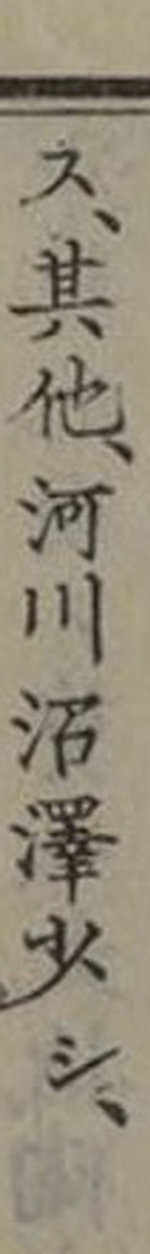ス、其他、河川沼沢少シ、
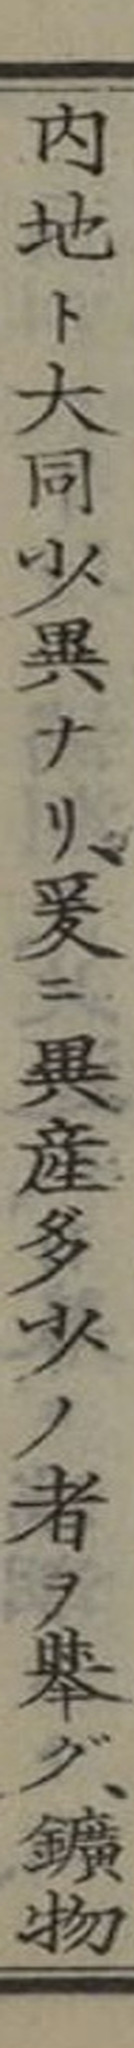内地ト大同少異ナリ、爰ニ異産多少ノ者ヲ挙グ、鉱物
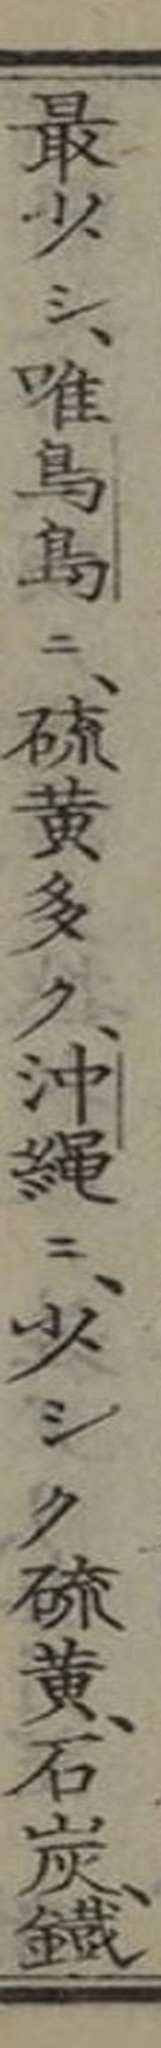最少シ、唯鳥島ニ、硫黄多ク、沖縄ニ、少シク硫黄、石炭、鉄
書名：琉球新誌 図附 上
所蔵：University of the Ryukyus Library
